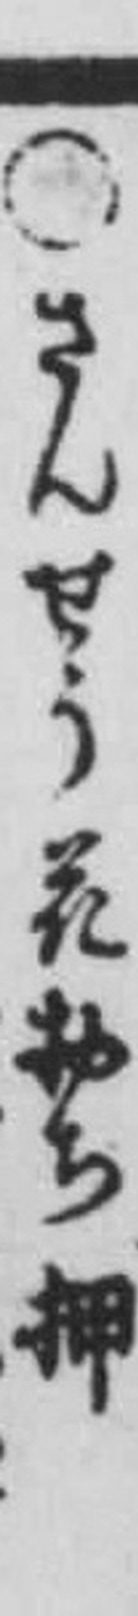〇さんせう花おち押
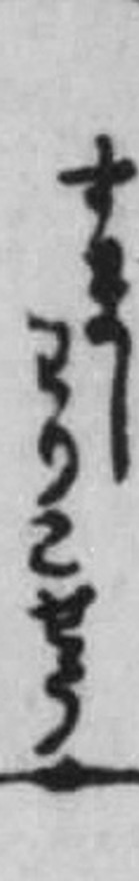わりこせう
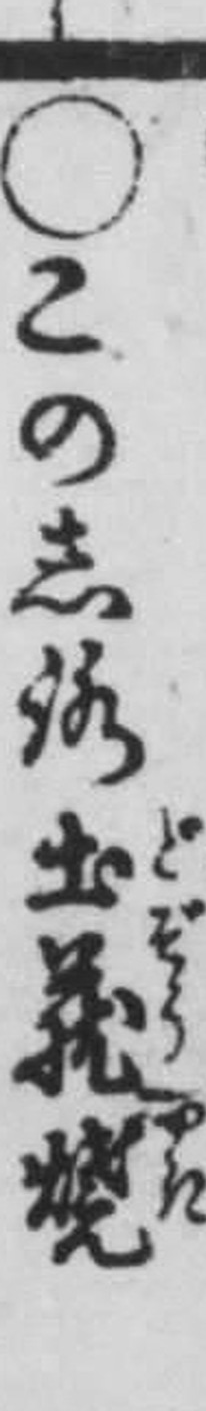〇このしろ土蔵焼
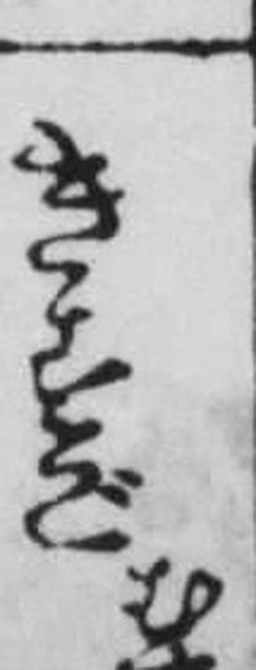きすご
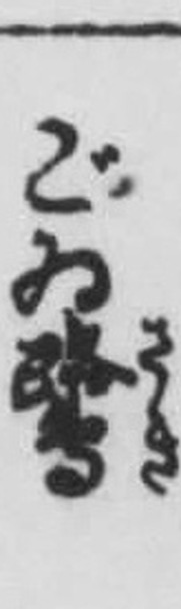ごゐ鷺
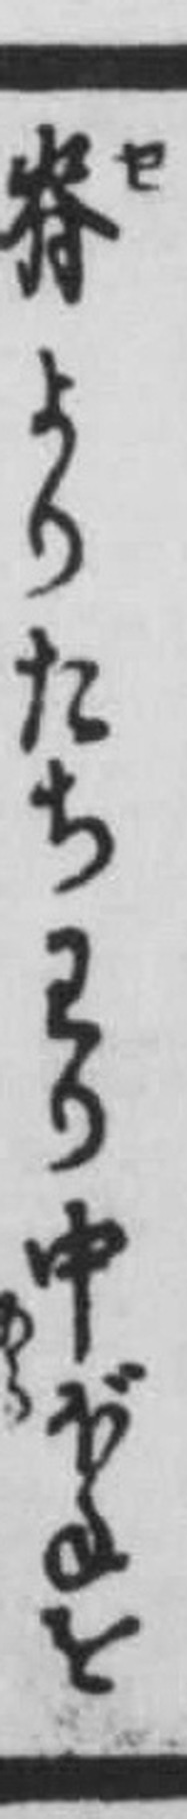背よりたちわり中ぼねを
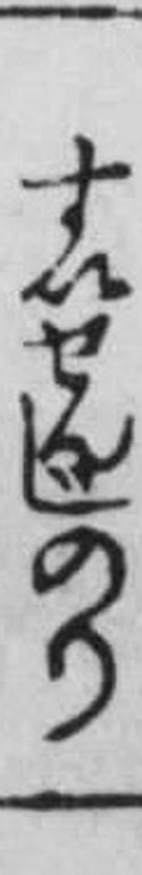すいせんじのり
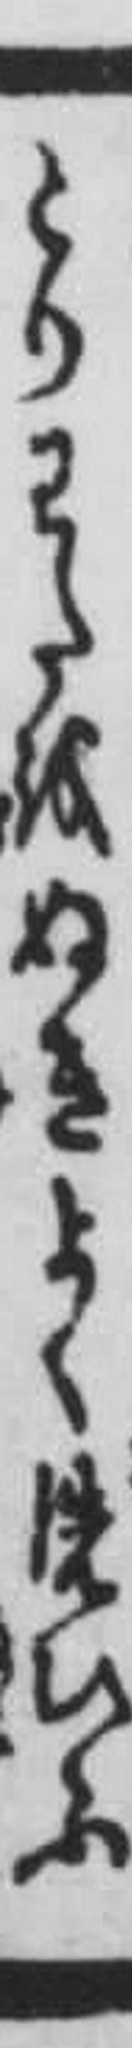とりわたをぬきよく洗いふ
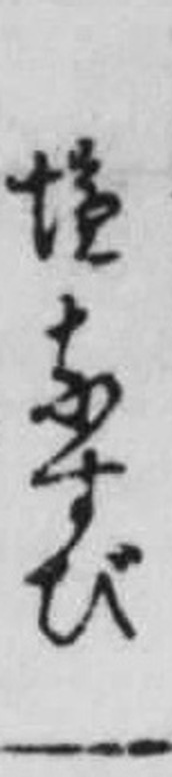塩なすび
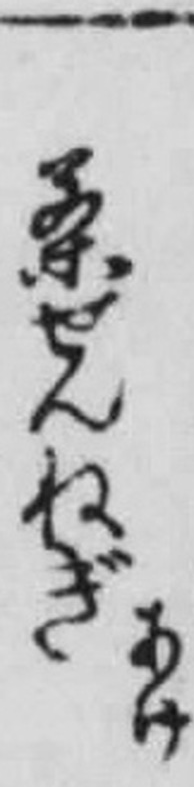茶せんねぎ
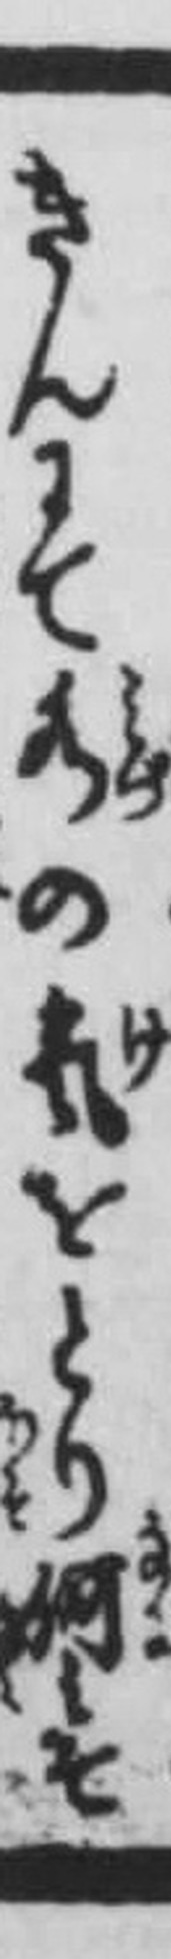きんにて水の気をとり何みそ
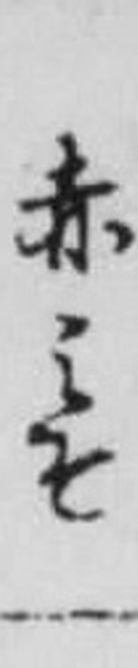赤みそ
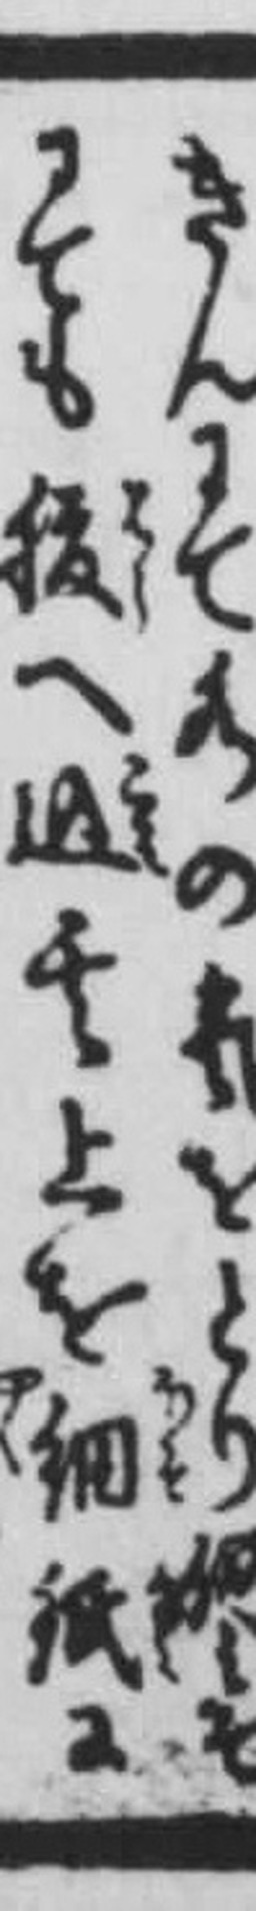にても腹へ込其上を細紙に
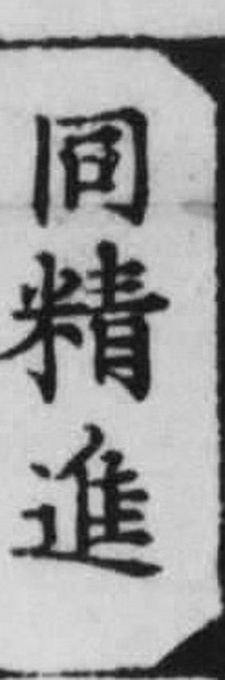同精進
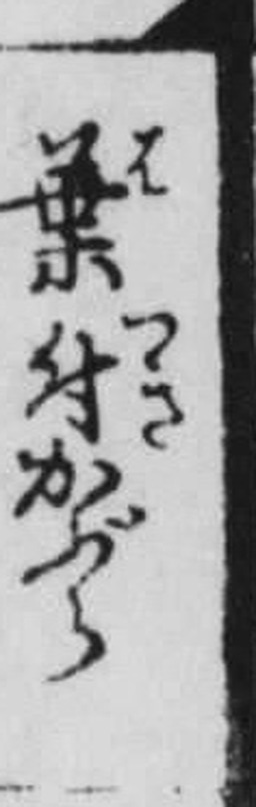葉付かぶら
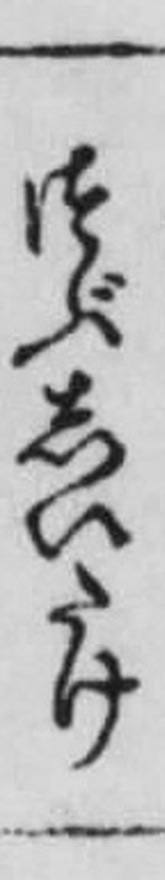つぶしいたけ
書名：日用重宝魚類精進/料理早工風
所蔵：大阪府立大学学術情報センター 国文学研究資料館
